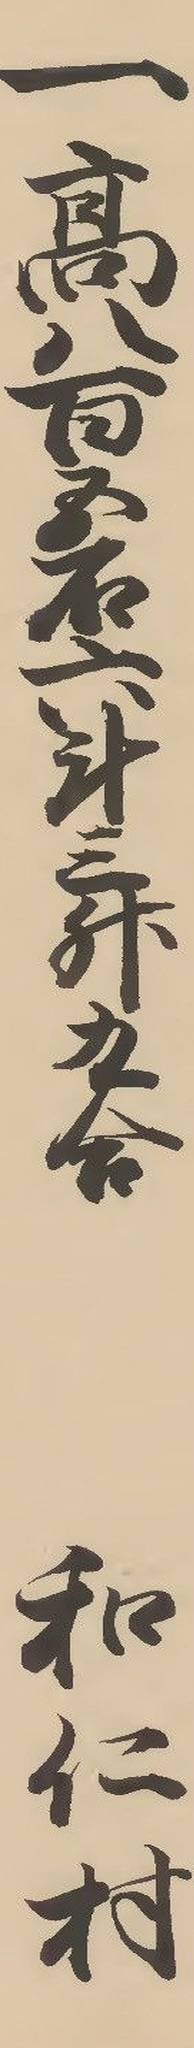一髙八百五石六斗三升九合和仁村
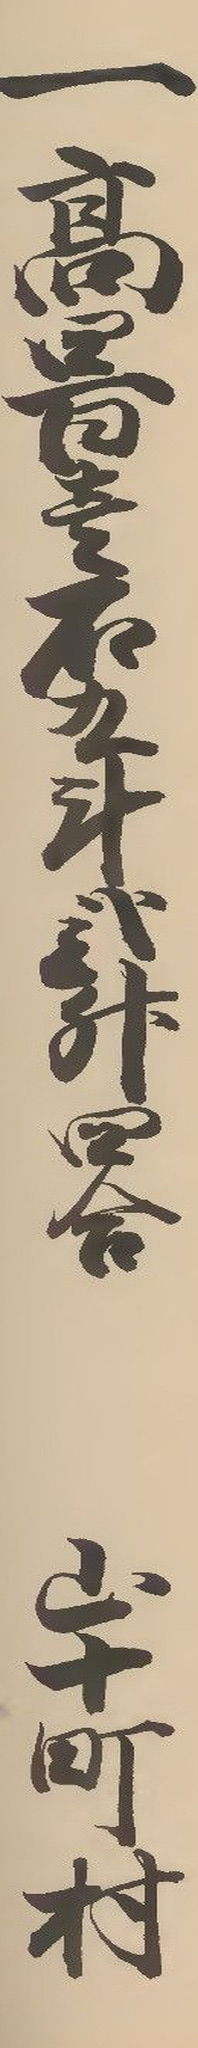一髙四百壱石九斗弐升四合山十町村
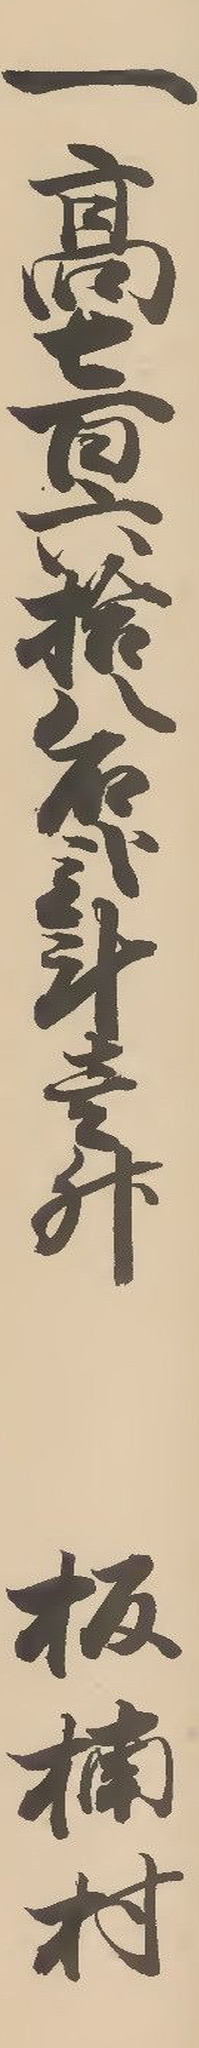一髙七百六拾八石弐斗壱升板楠村
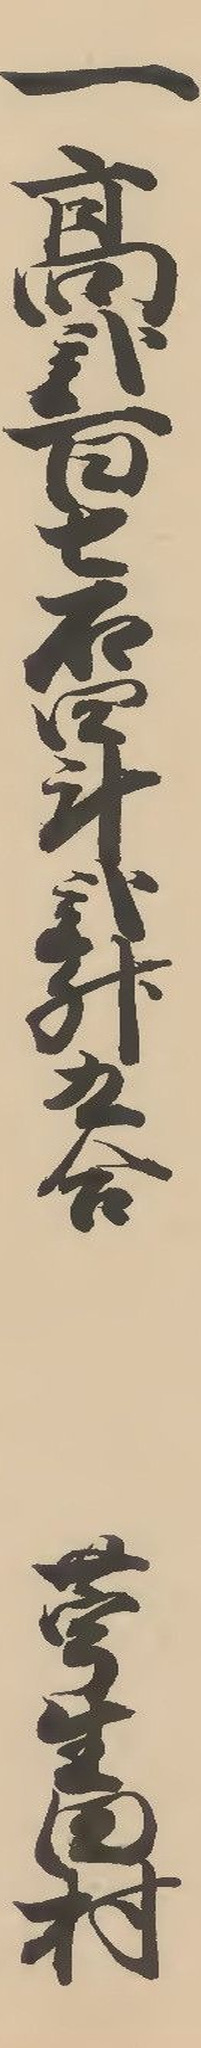一髙弐百七石四斗弐升九合芋生田村
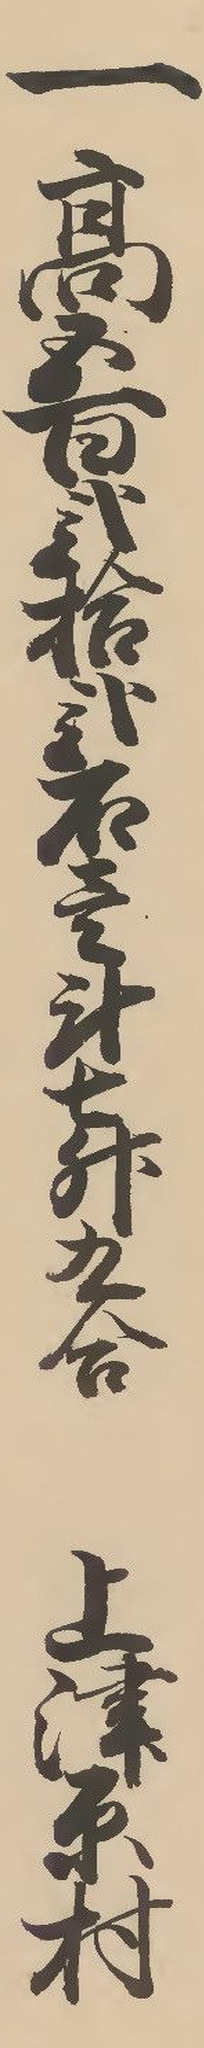一高五百弐拾弐石壱斗七升九合上津原村
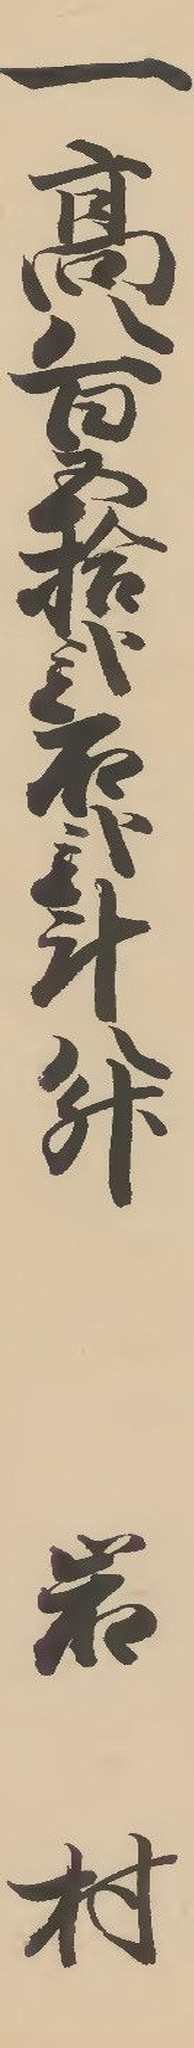一高八百五拾弐石弐斗八升岩村
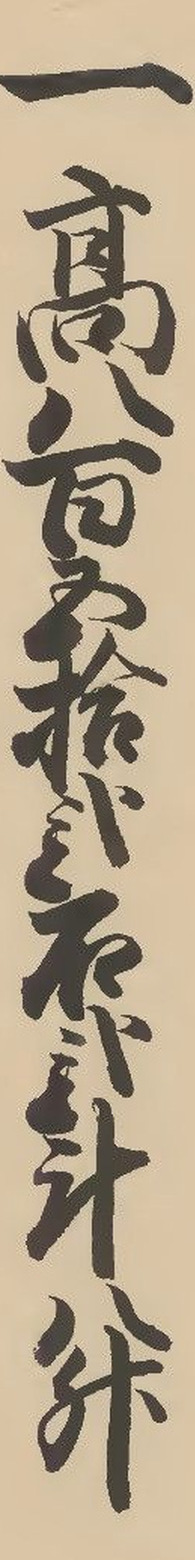一高八百五拾弐石弐斗八升岩村

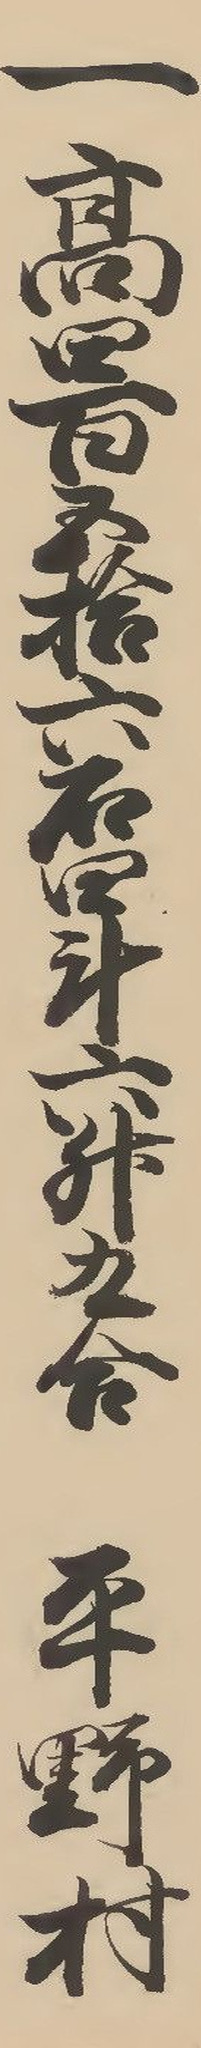一高四百五拾六石四斗六升九合平野村
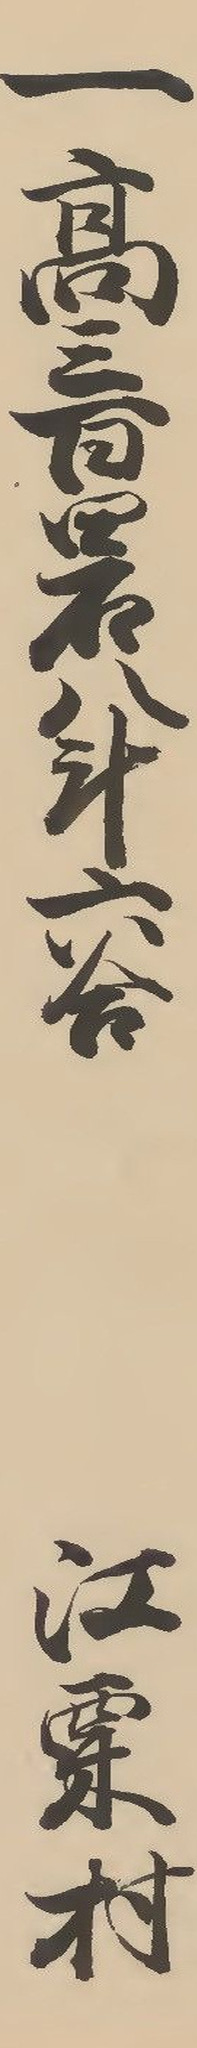一高三百四石八斗六合江栗村
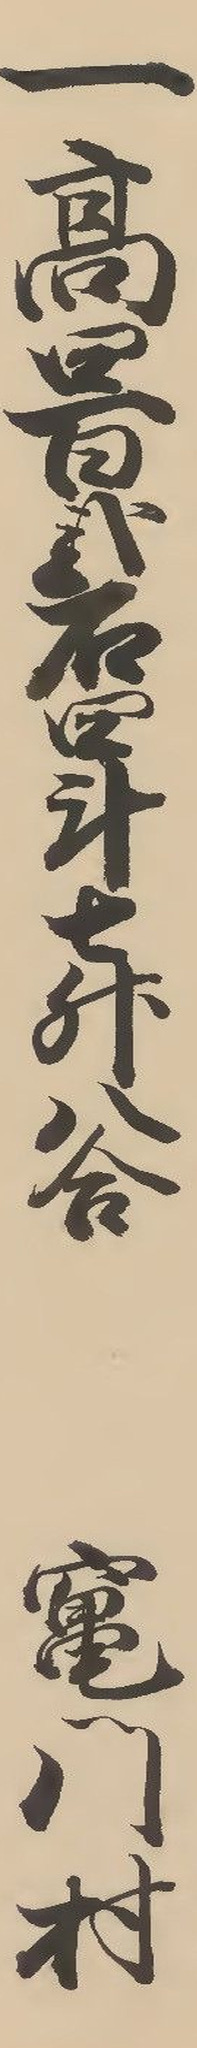一高四百弐石四斗七升八合竈門村
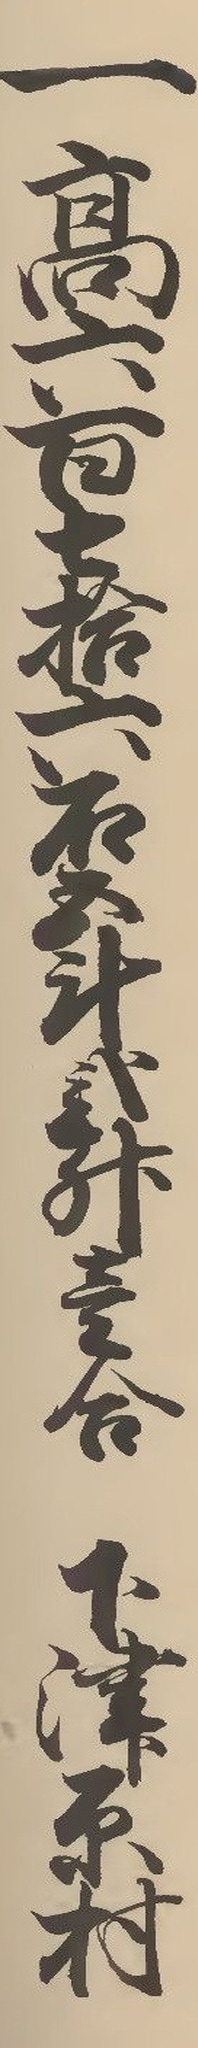一高六百七拾六石五斗弐升壱合下津原村
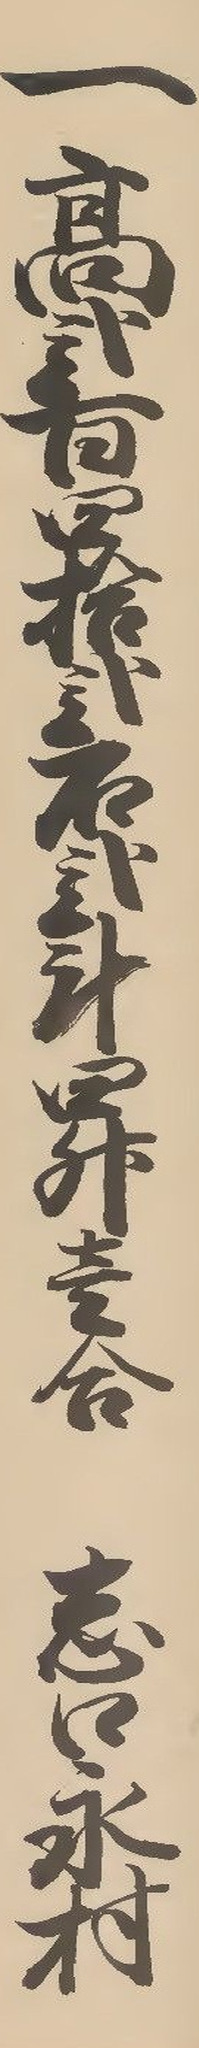一高弐百四拾弐石弐斗四升壱合志口永村
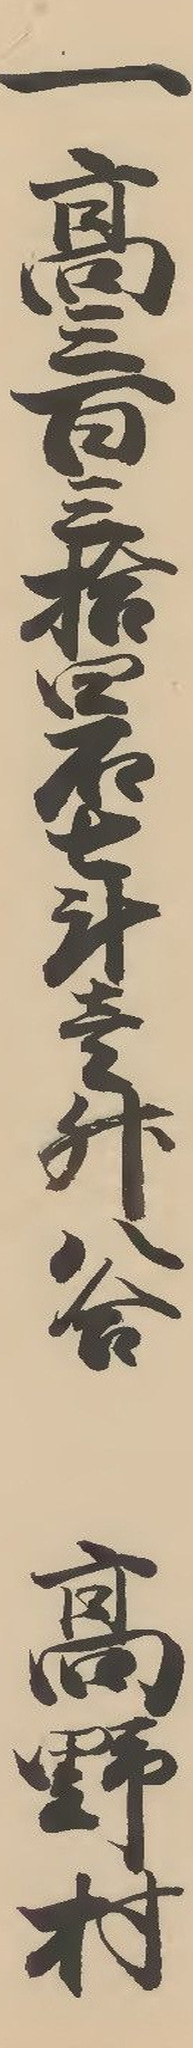一高三百三拾四石七斗壱升八合高野村
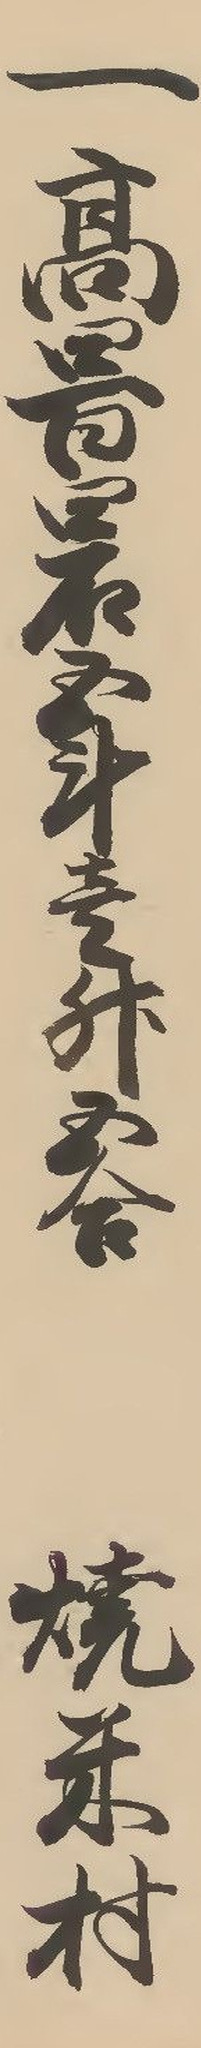一高四百四石五斗壱升五合焼米村
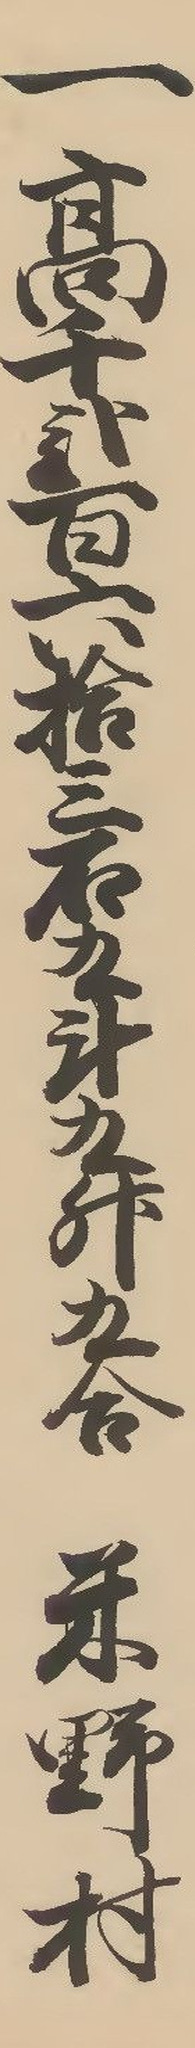一高千弐百六拾三石九斗九升九合米野村

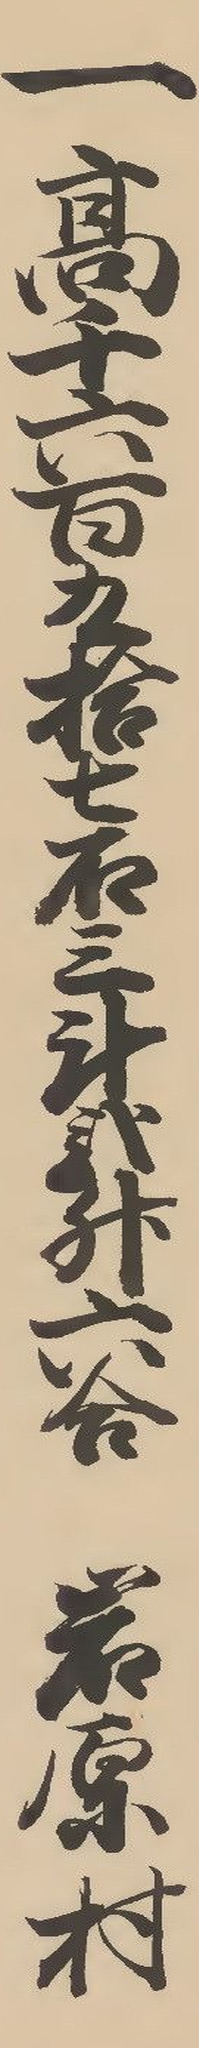一髙千六百九拾七石三斗弐升六合岩原村
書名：肥後国郷帳
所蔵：国立公文書館 National Archives of Japan
